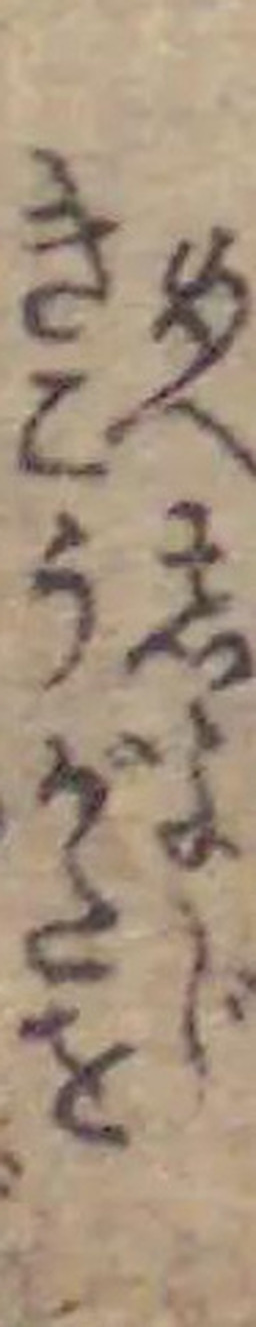きこうがたを
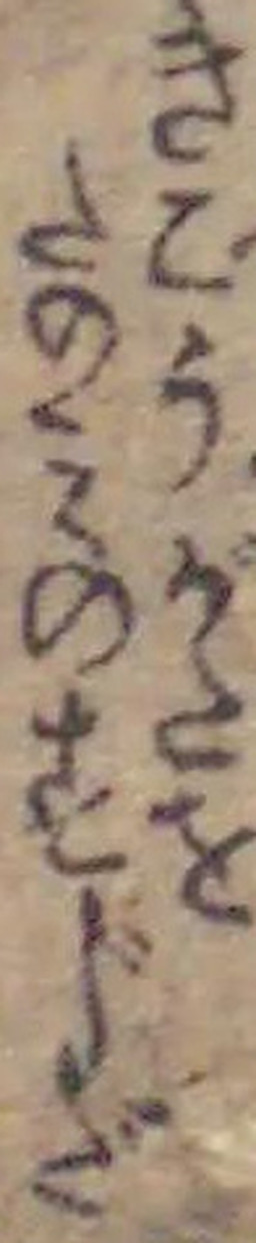たのみのすじだ

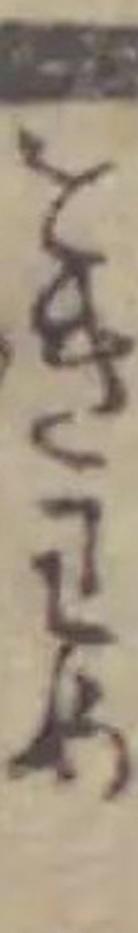をきわめ
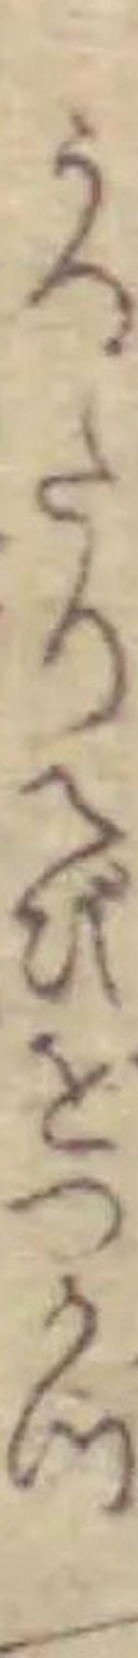うつたりへびをつかつ

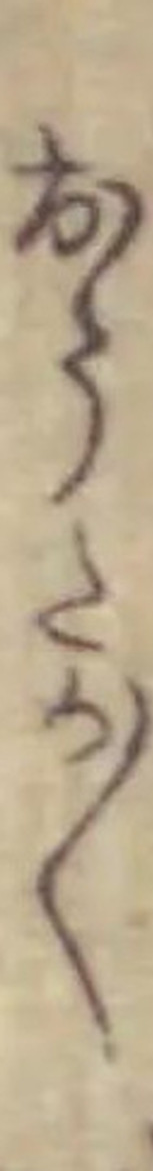おうたか〳〵
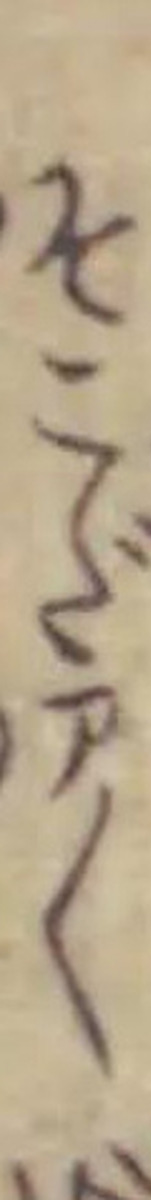そこだァ〳〵

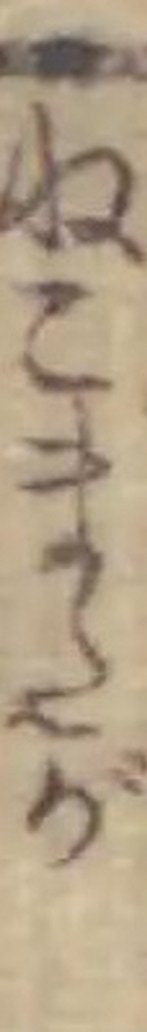ねこまたが
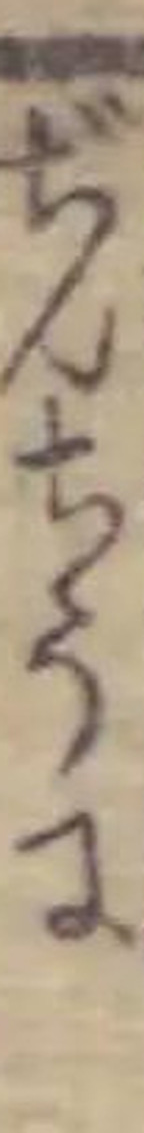じんちうに
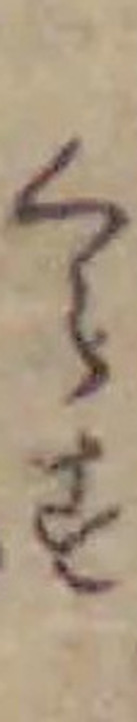くらす
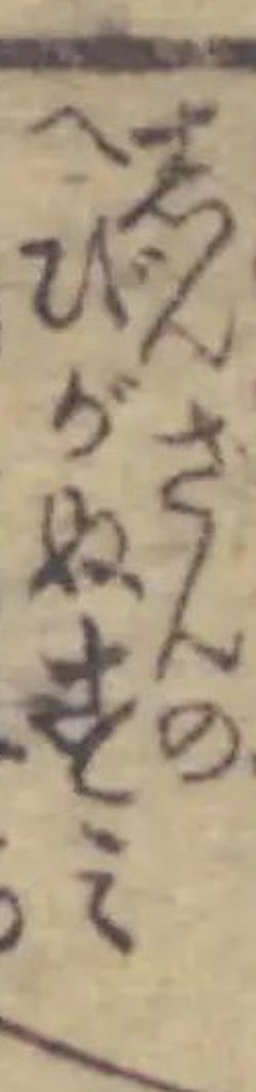へびがぬすみ
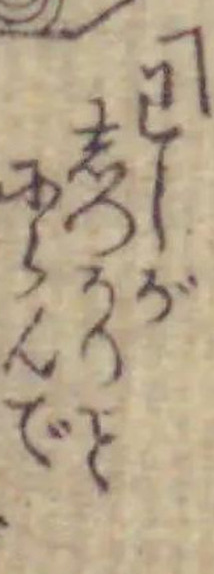しつかりと
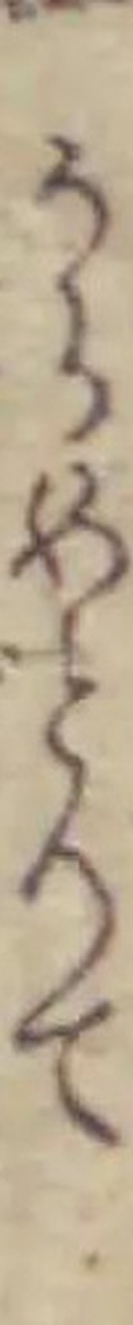からめとりて
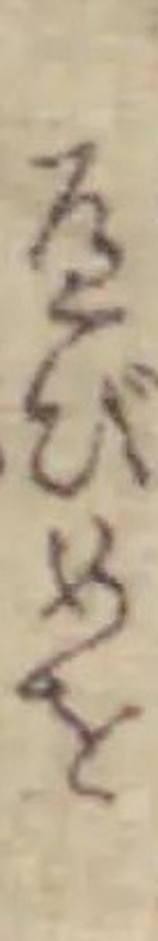へびめを
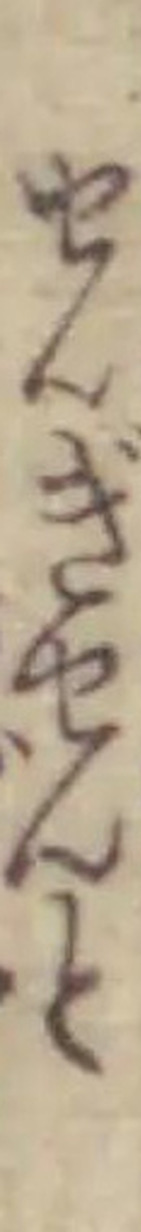せんぎせんと
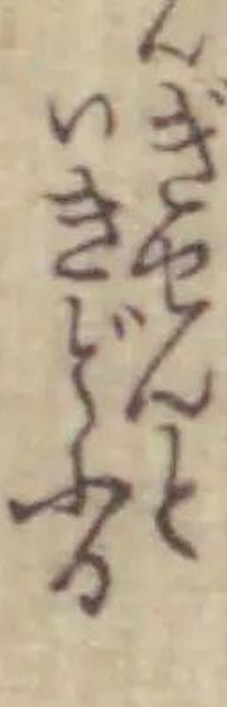いきどふる
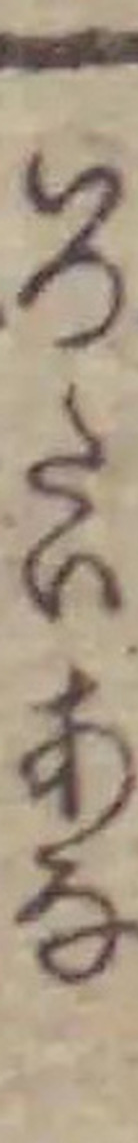いつたいあな
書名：化物太平記 3巻
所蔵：国立国会図書館 National Diet Library, JAPAN
